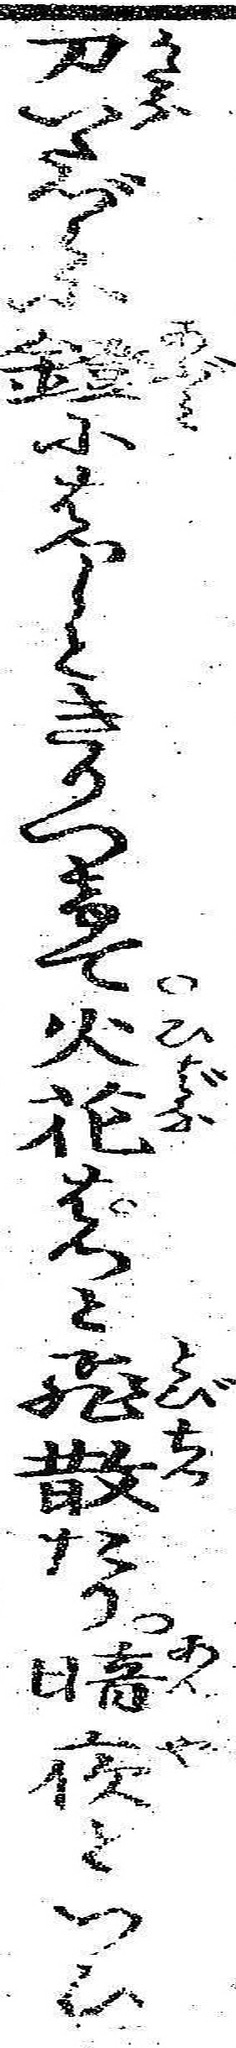刀いたづらに鐙にはつしときりつけて。火花ぱつと飛散たり。暗夜といひ
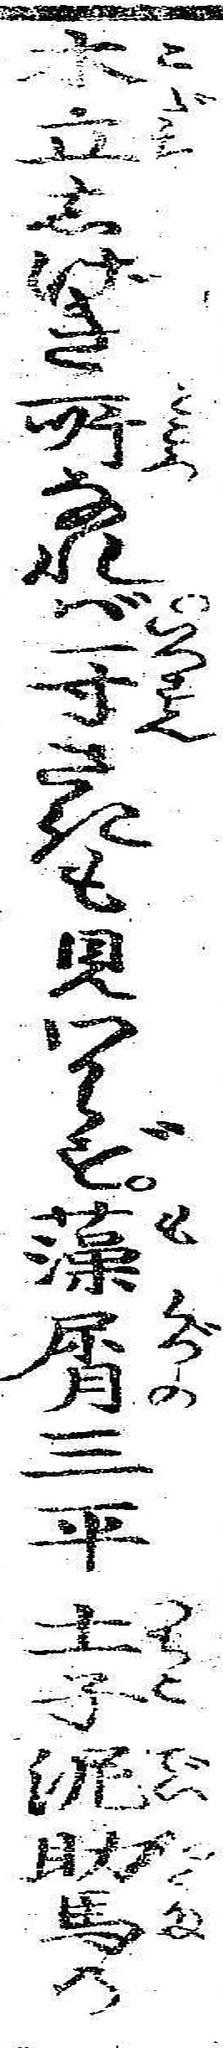木立しげき所なれば。一寸さきも見わからず。藻屑三平土子泥助馬の
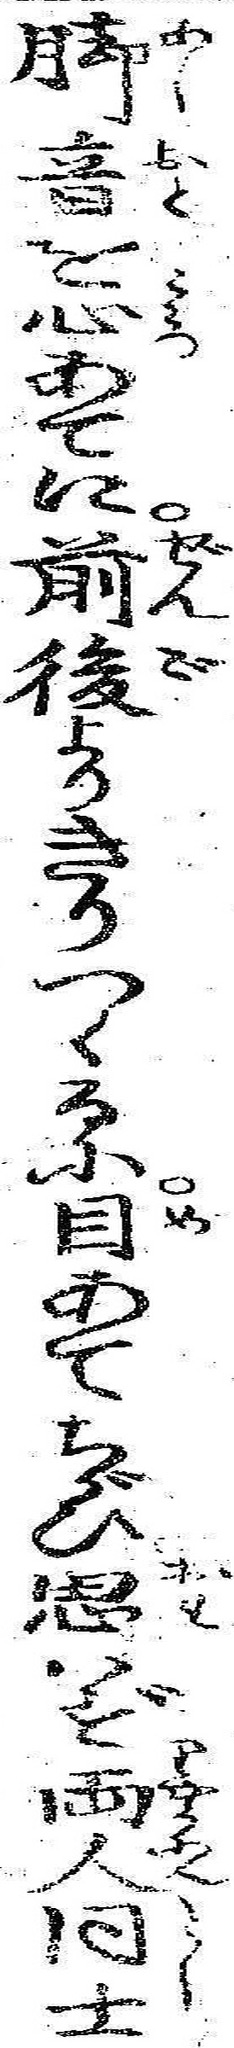脚音を心あてに。前後よりきりつくるに。目あてちがひ思はず両人同士
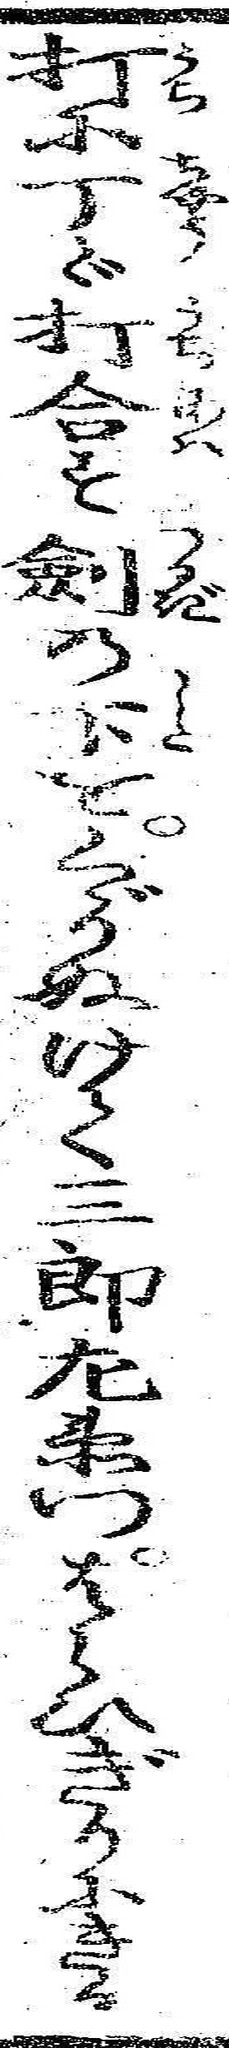打に丁ど打合す剣の下を。くゞりぬけて三郎左衛門。はらひぎりにきる
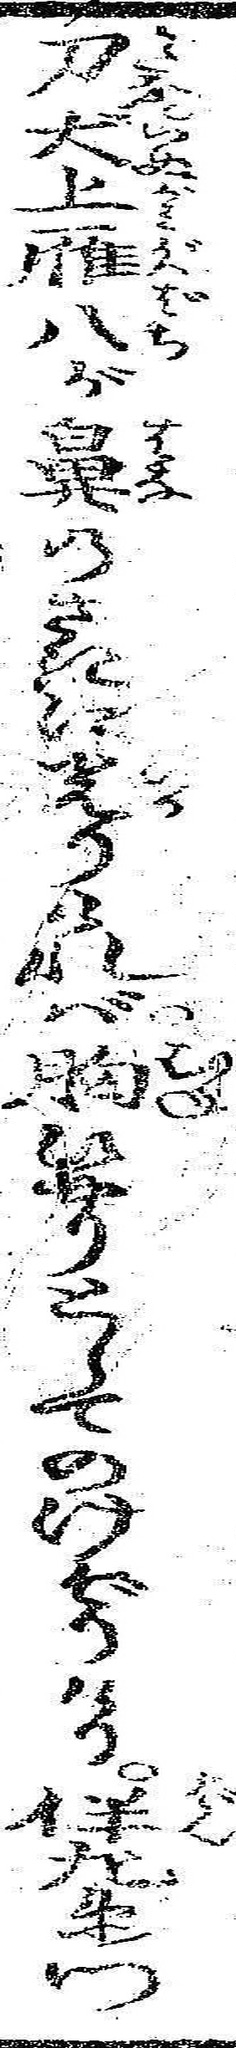刀。大上雁八が鼻のさきに光ければ。胸ひやりとしてのけぞりけり。伴左衛門
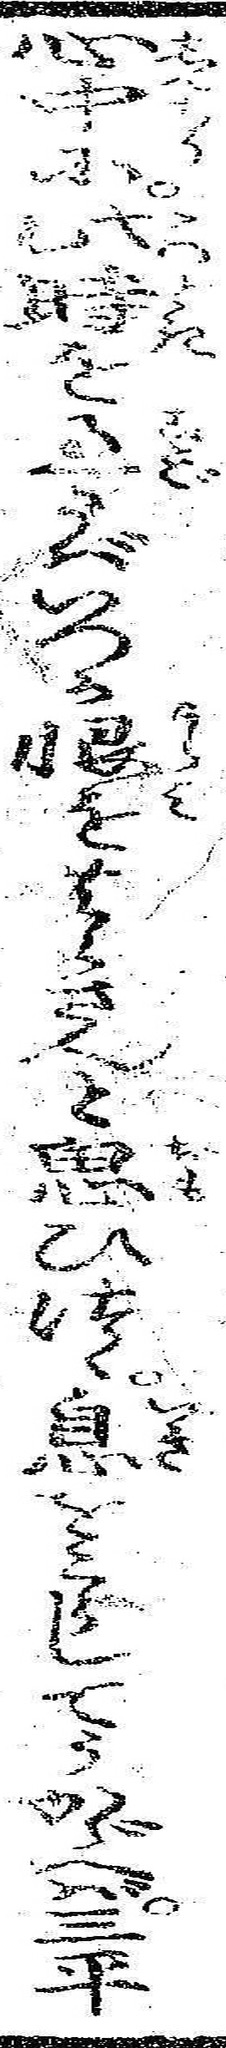心中に。此時を過さばいつか恨をはらさんと思ひつゝ。息をこらしてうかゞへば。三平
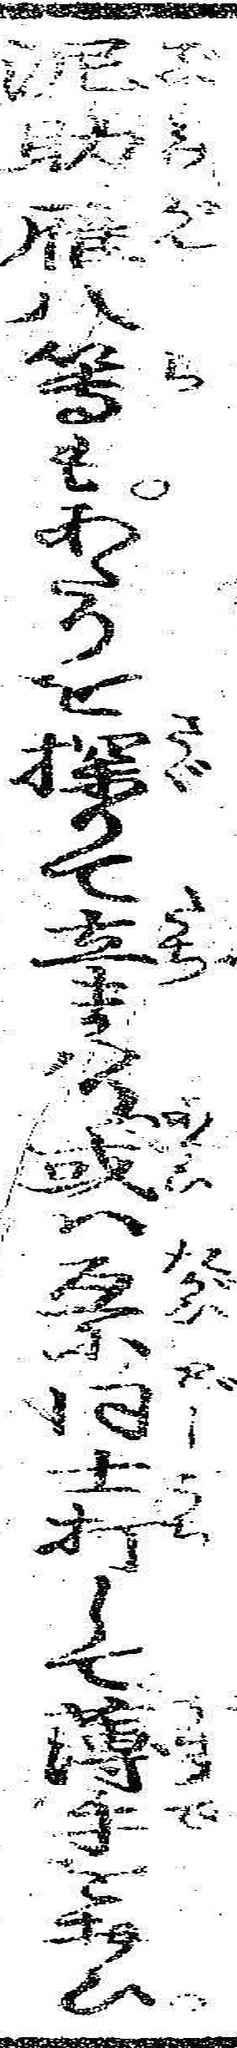泥助雁八等も。あたりを探りて立まはり。或は互に同士打して薄手をおひ。
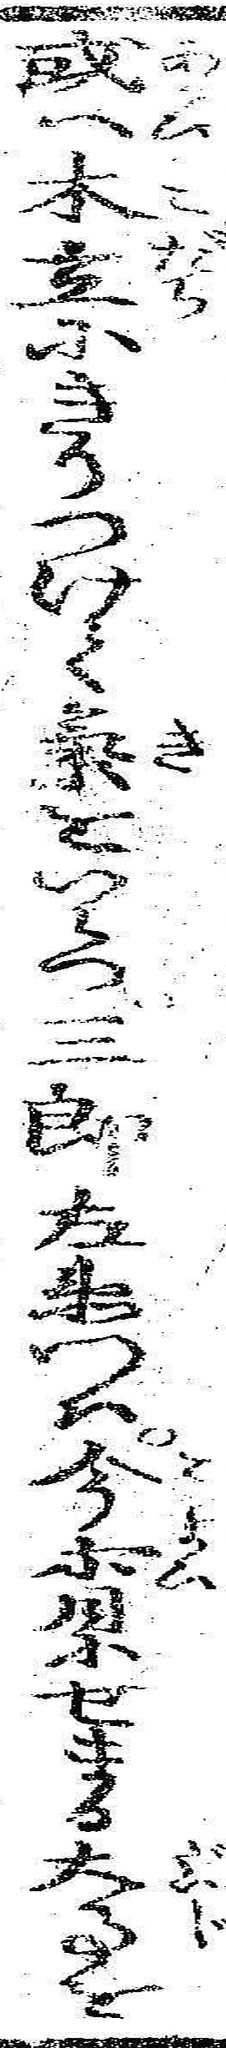或へ木立にきりつけて気をいらつ。三郎左衛門は。今宵にせまる大事を
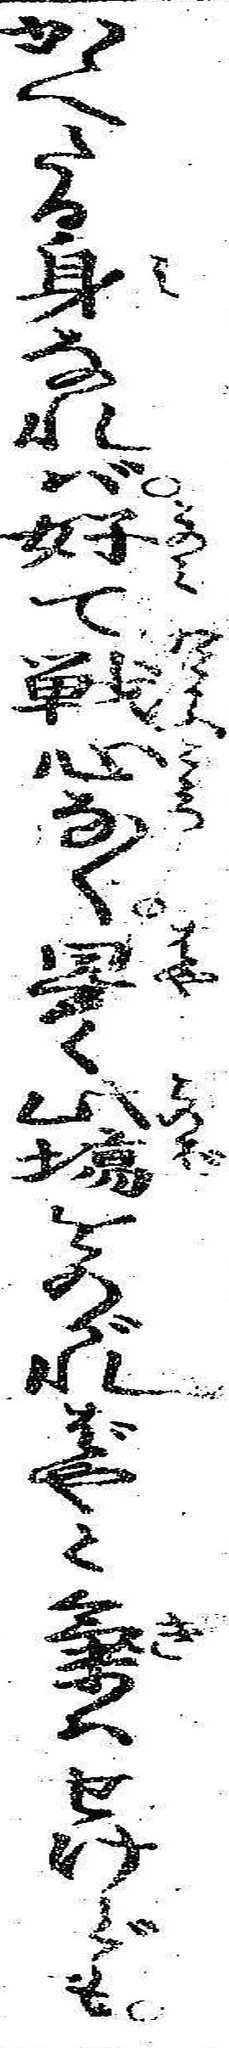かゝへたる身なれば。好て戦心なく。早く此場をのがればやと気はせけども。
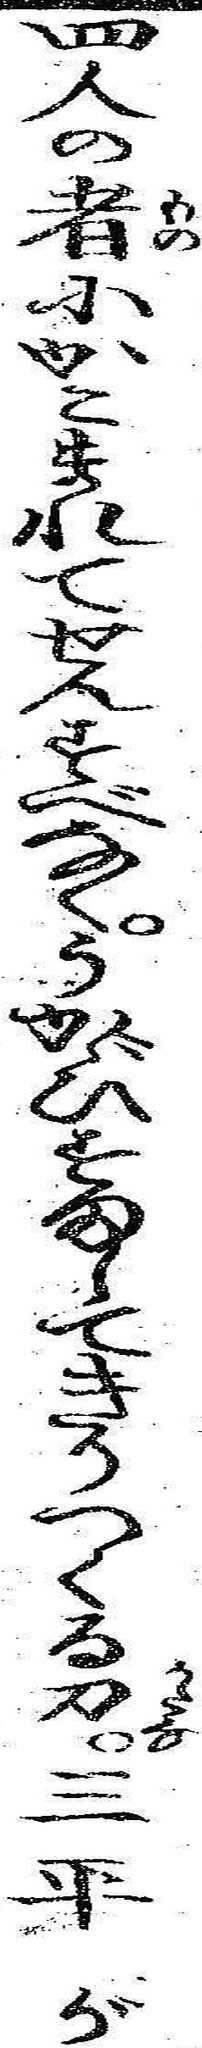四人の者にかこまれてせんすべなく。うかゞひすましてきりつくる刀。三平が
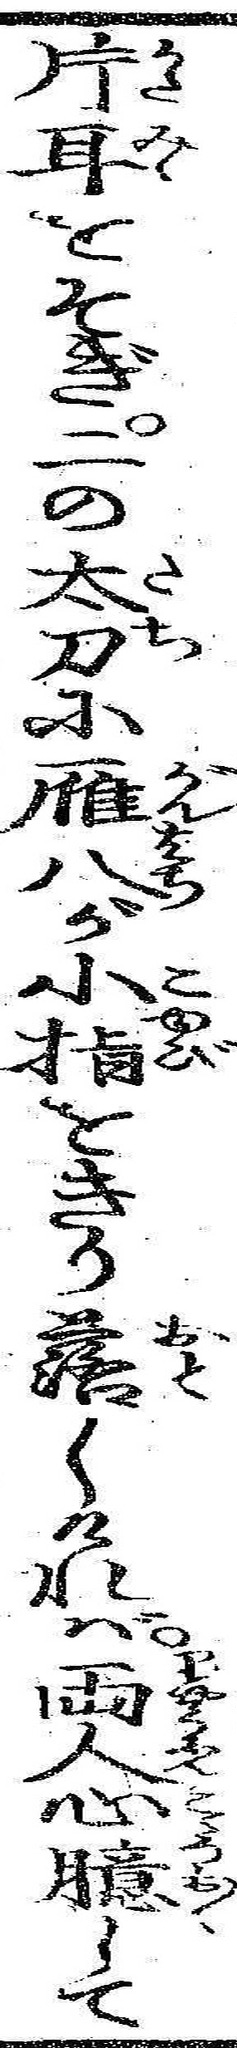片耳をそぎ。二の太刀に雁八が小指をきり落しければ。両人心臆して
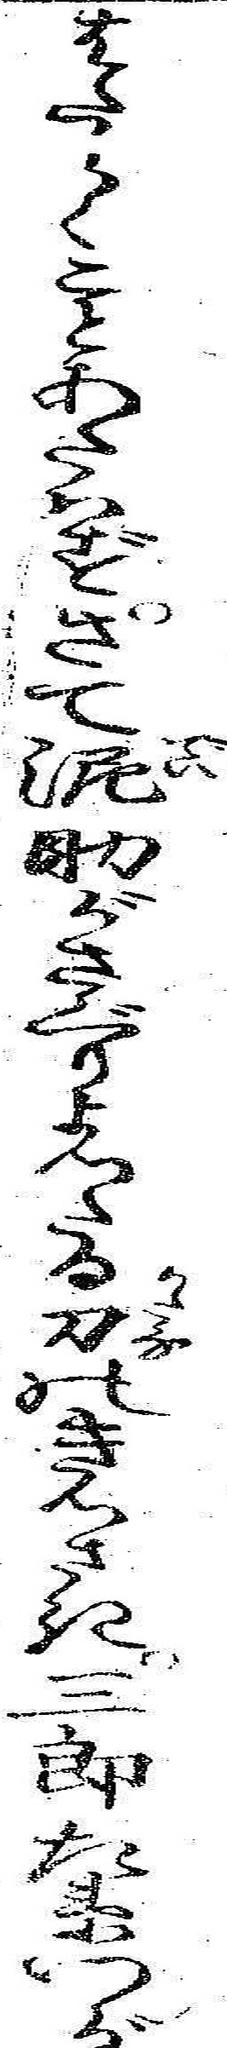はたらくことあたはず。さて泥助がさぐりよつたる刀のきつさき。三郎左衛門が
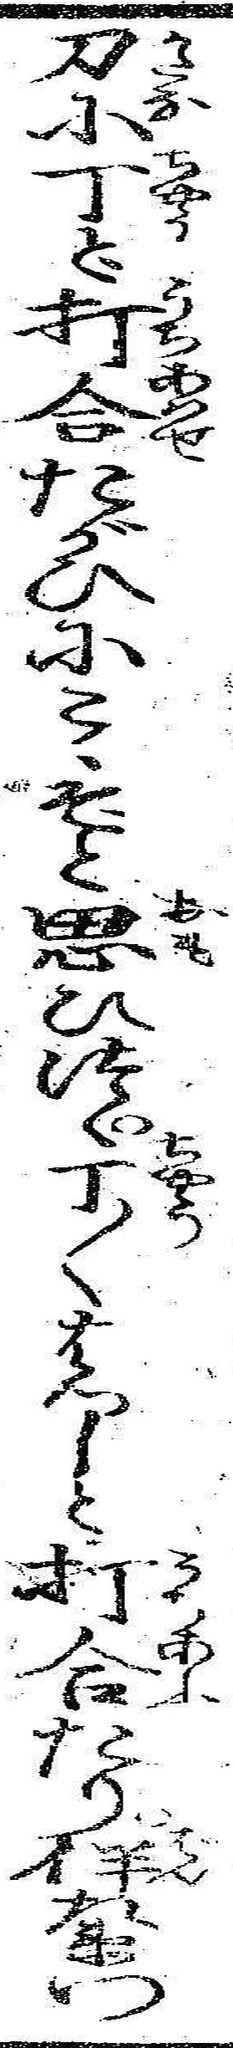刀に丁ど打合たがひにこゝぞと思ひつゝ。丁々はつしと打合たり。伴左衛門
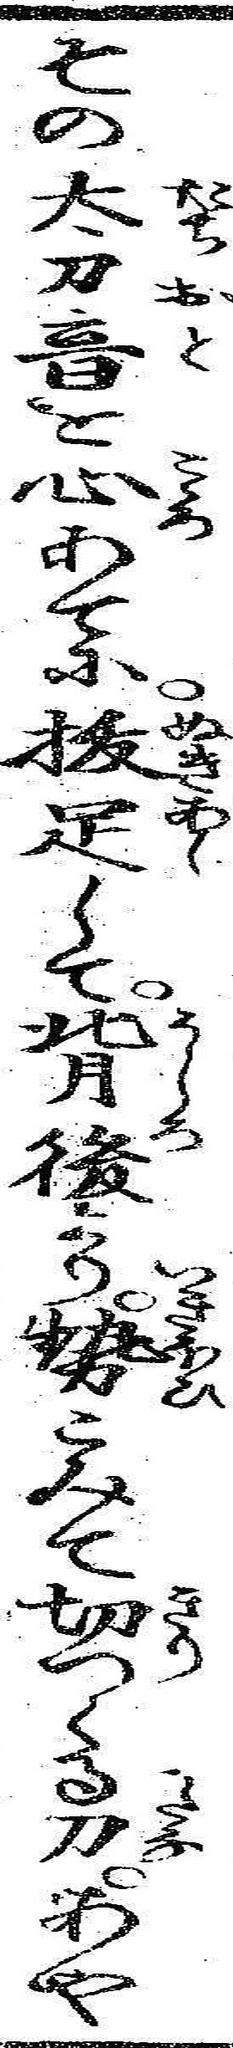その太刀音を心あてに。抜足して。背後より。勢こみて切つくる刀。あや
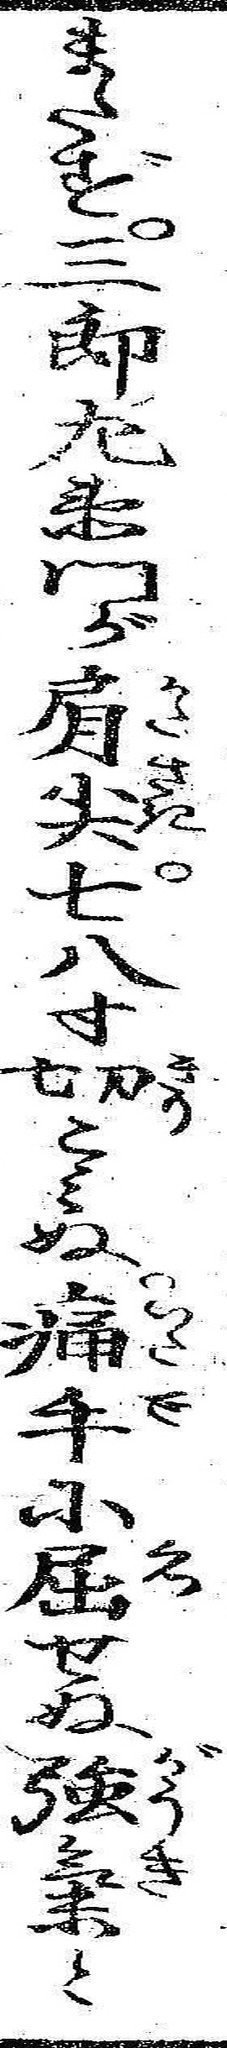またず。三郎左衛門が肩尖。七八寸切こみぬ。痛手に屈せぬ強気と
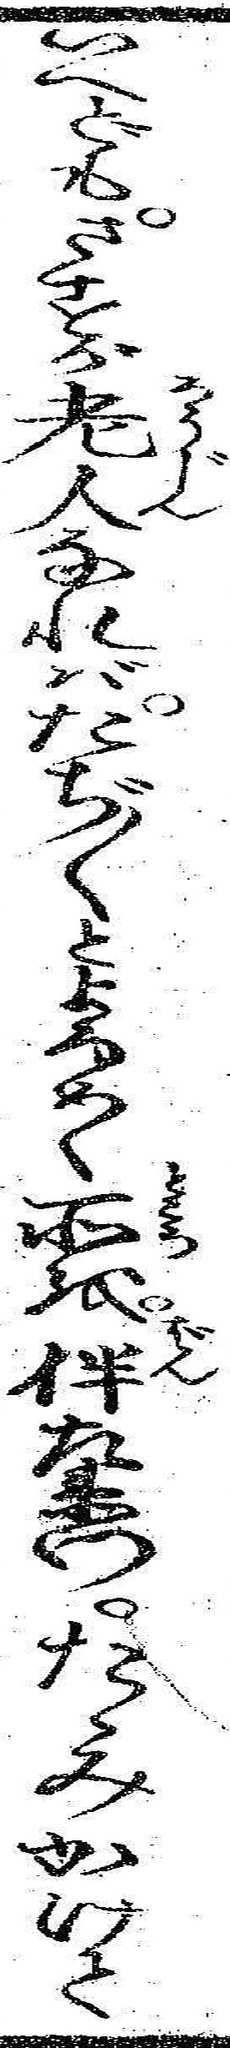いへども。さすが老人なれば。たぢ〳〵とよろめく所を。伴左衛門。たゝみかけて
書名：昔話稲妻表紙
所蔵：国文学研究資料館
